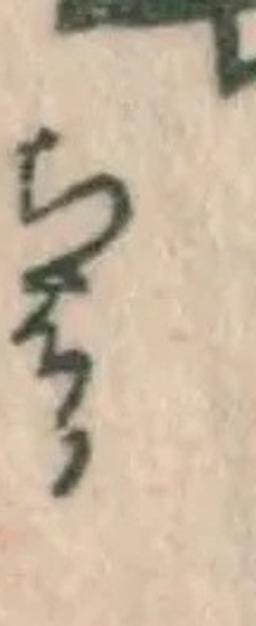ちはる
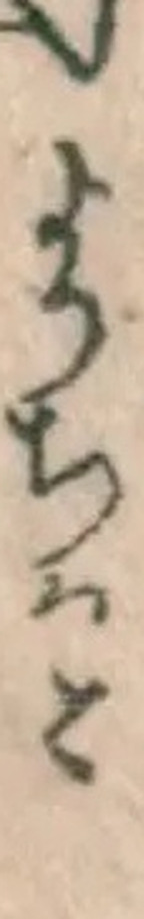よりちかと
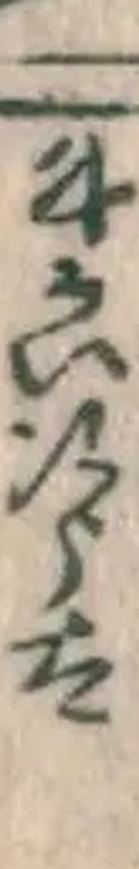牛かい次郎太
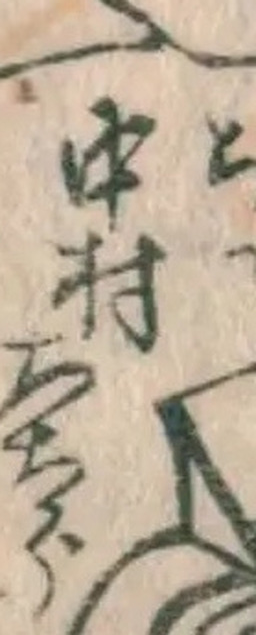中村大太郎
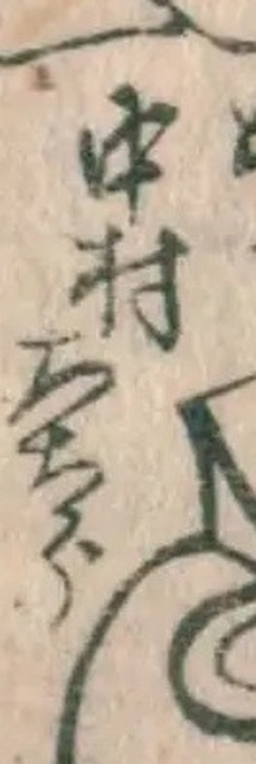中村大太郎
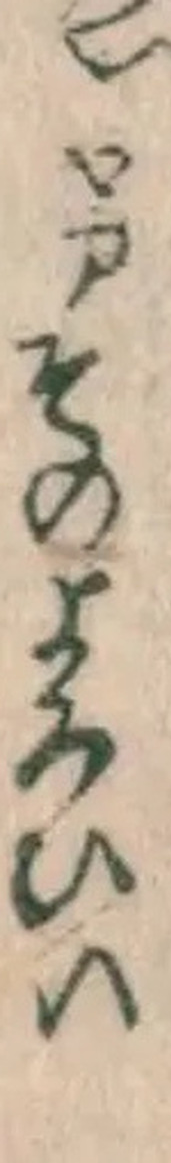ヤアそのよろひは
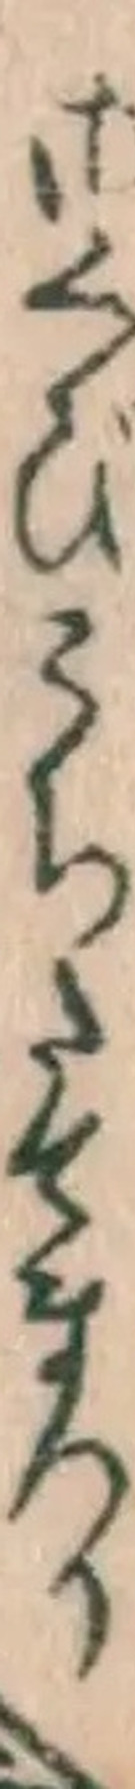御くびうちたてまつり
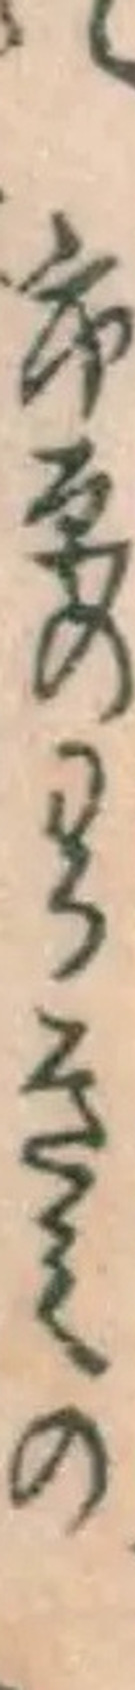市原のわかきみの
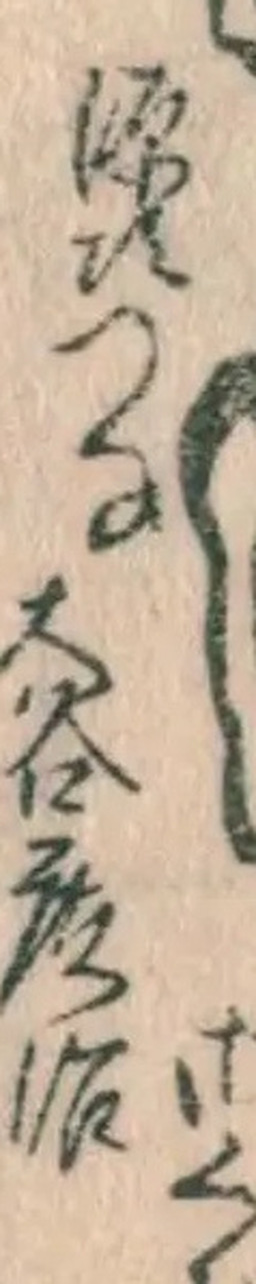源治つな大谷広治
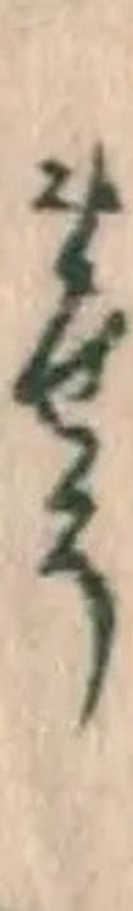ませう
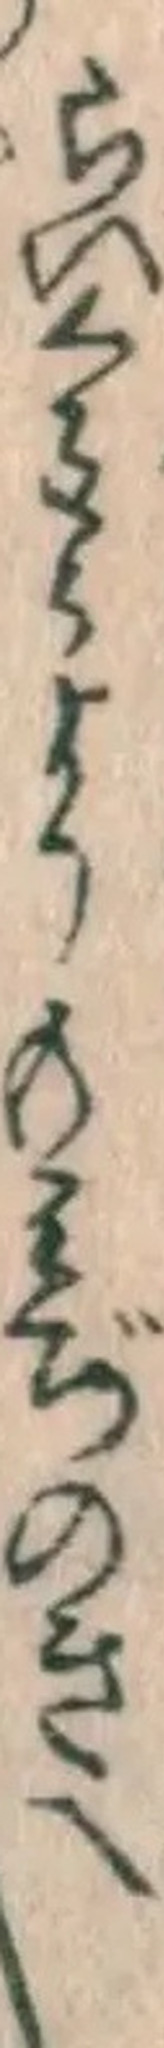らいくわうよりもみぢのきへ
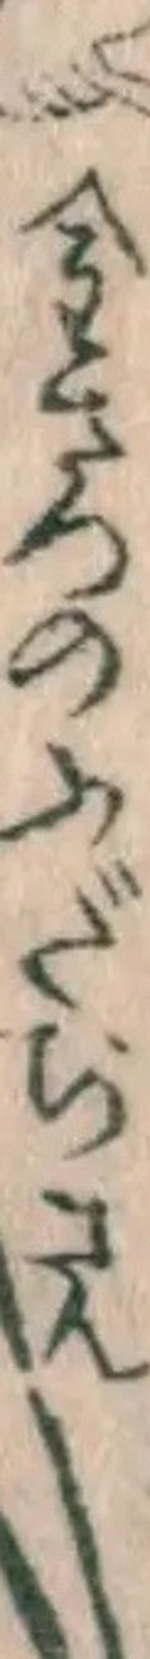金さつのふだぢさん
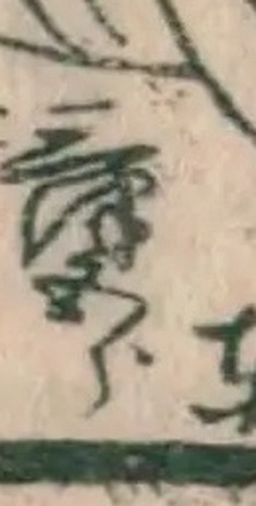三津五郎
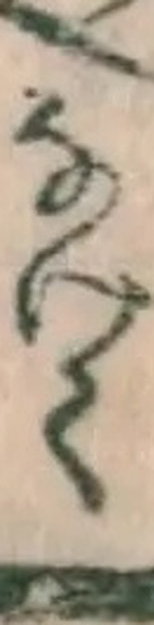なけく
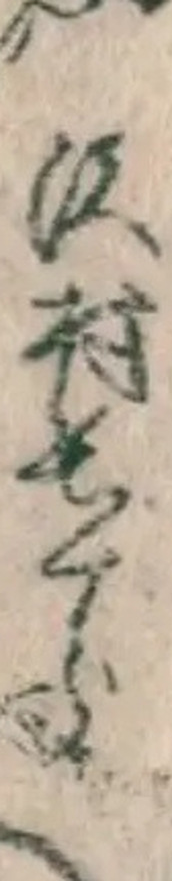沢村長十郎
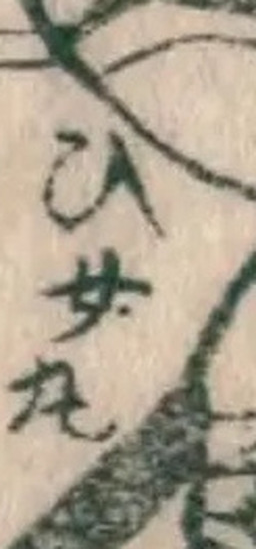ひ女丸
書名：菊慈童酒宴岩窟
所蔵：国立国会図書館 National Diet Library, JAPAN
